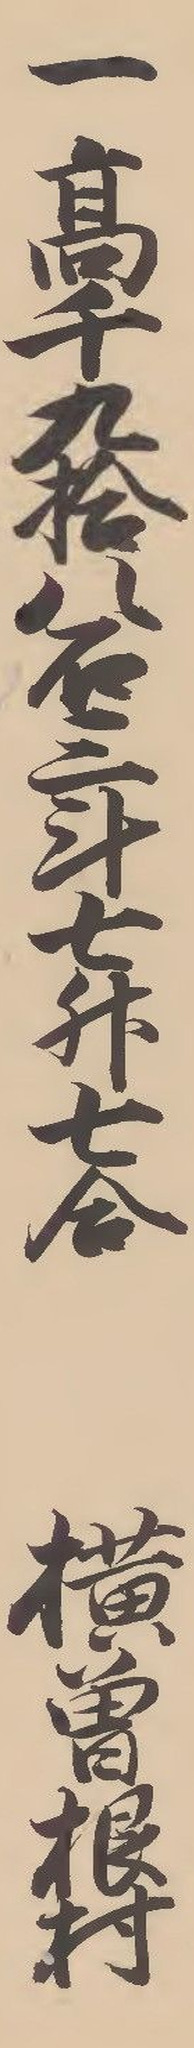一高千九拾八石三斗七升七合横曽根村
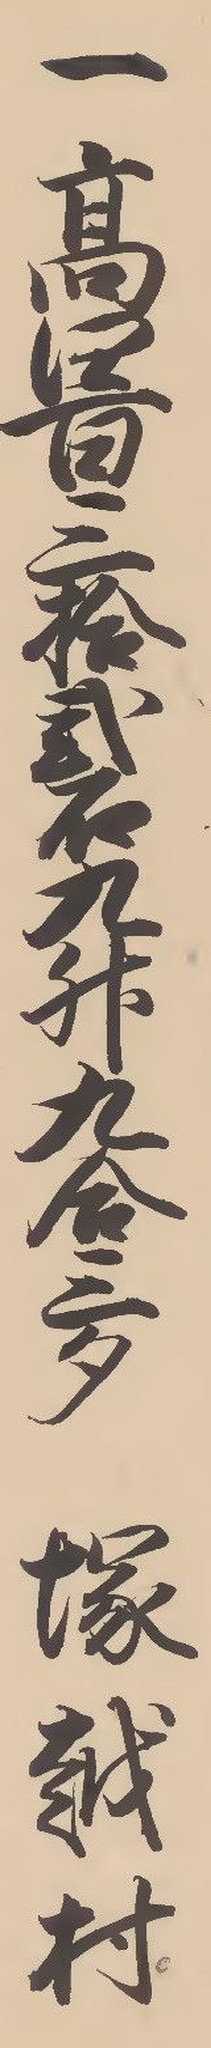一高四百三拾弐石九升九合三勺塚越村
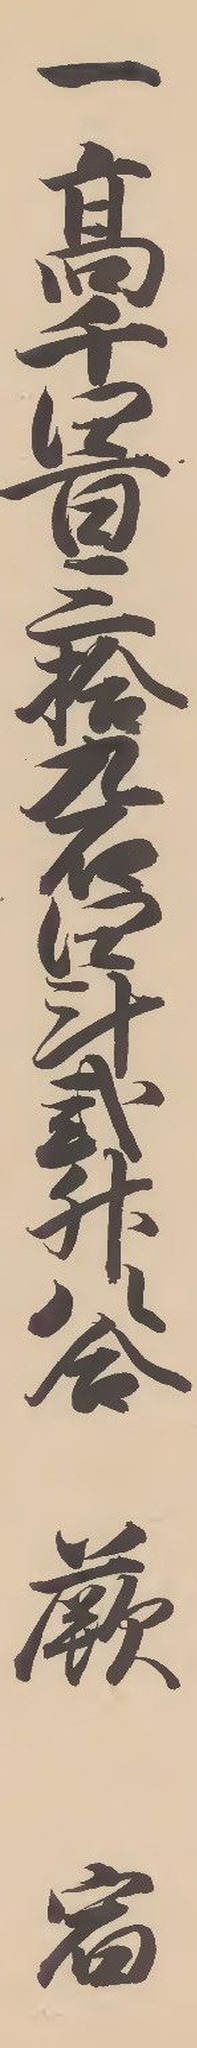一高千四百三拾九石四斗弐升八合蕨宿
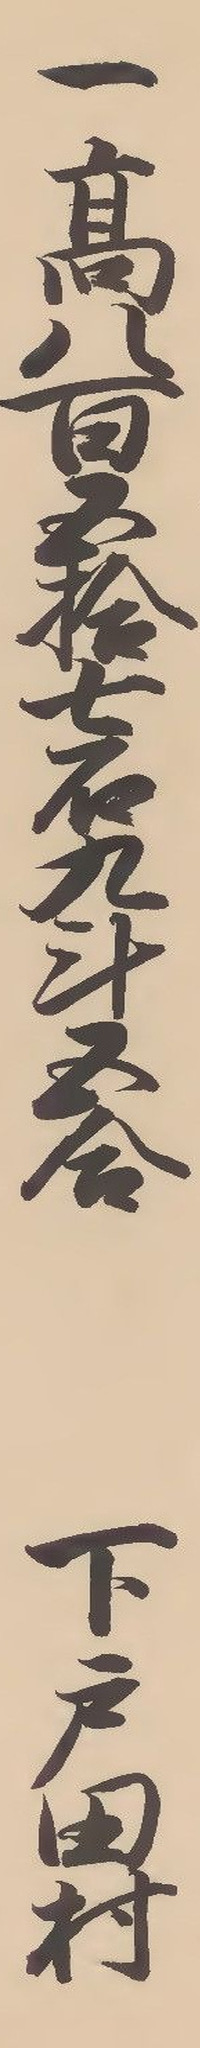一高八百五拾七石九斗五合下戸田村
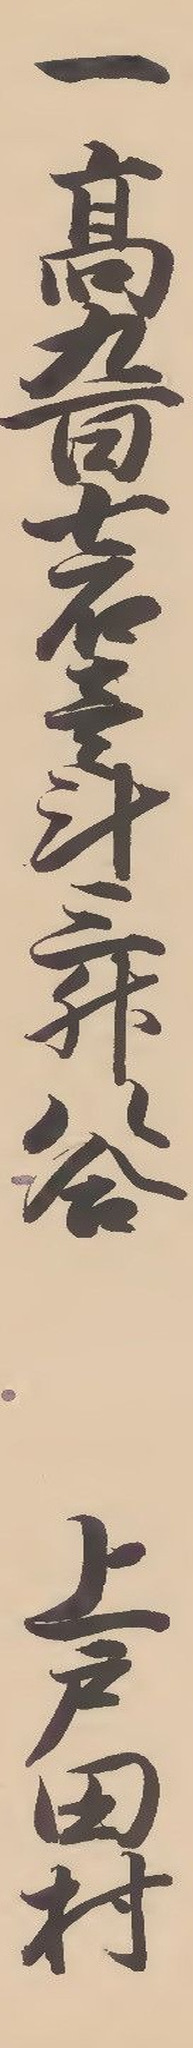一高九百七石壱斗三升八合上戸田村

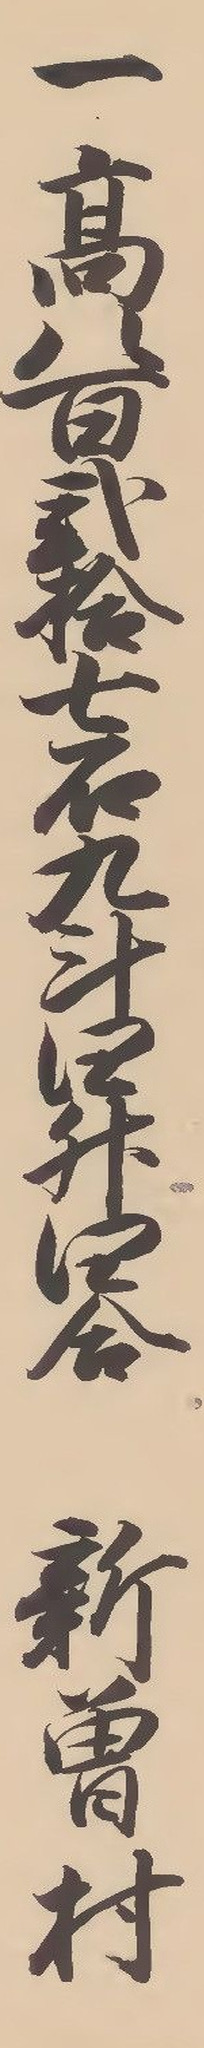一高八百弐拾七石九斗四升四合新曽村
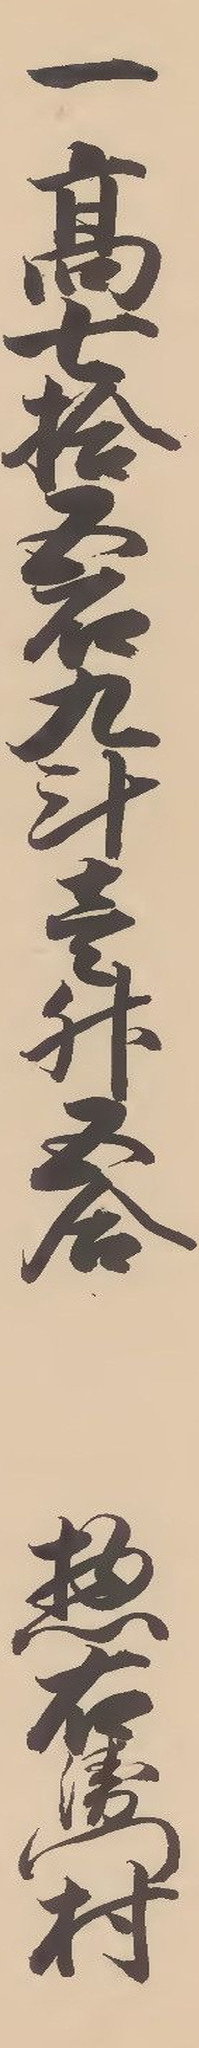一高七拾五石九斗壱升五合惣右衛門村
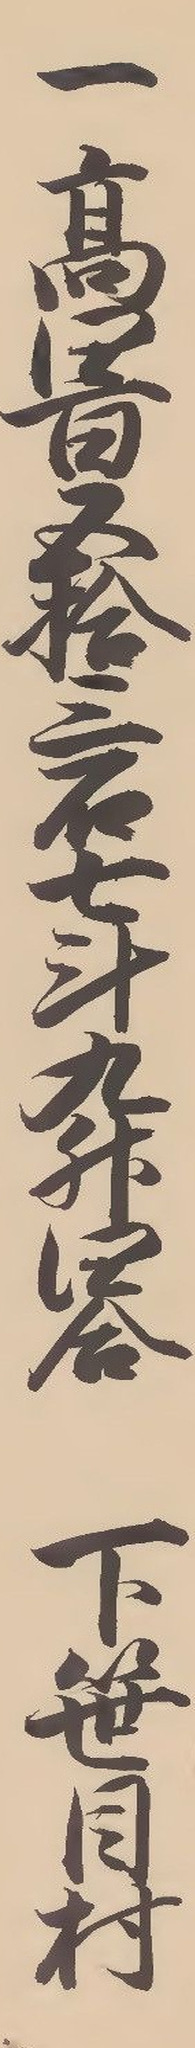一高四百五拾三石七斗九升四合下笹目村
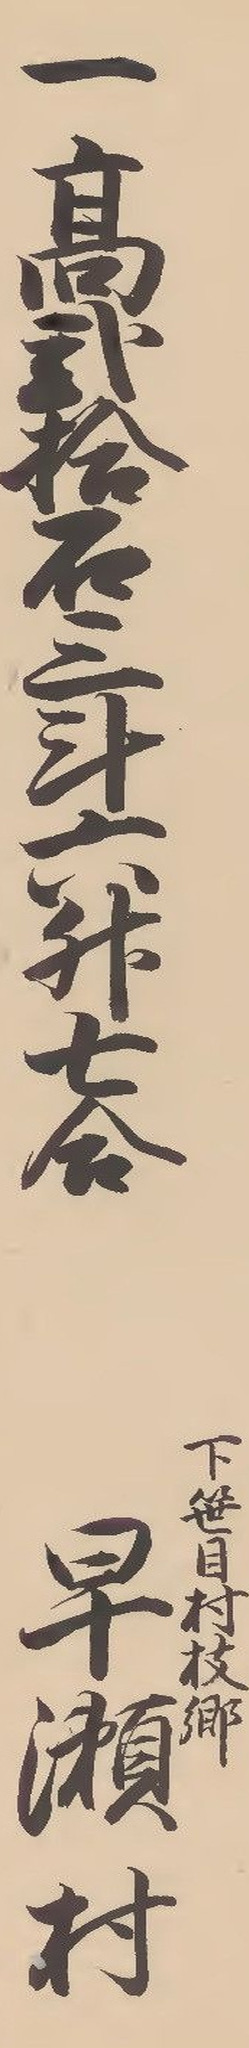一高弐拾石三斗六升七合早瀬村
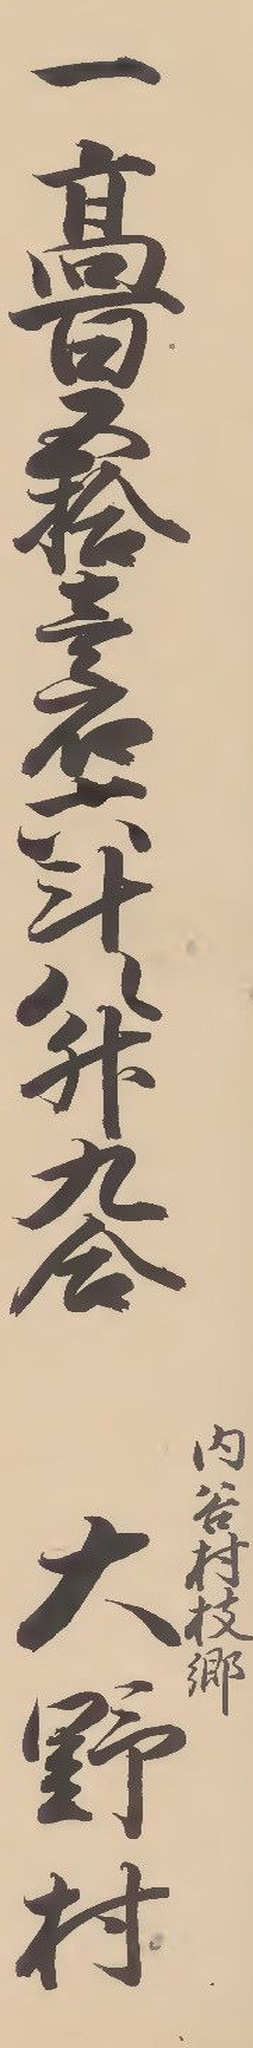一高百五拾壱六斗八升九合大野村
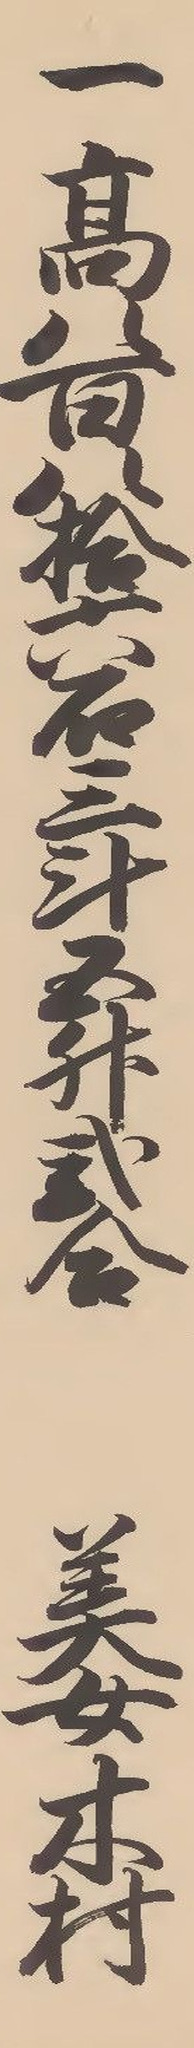一高八百八拾六石三斗五升弐合美女木村
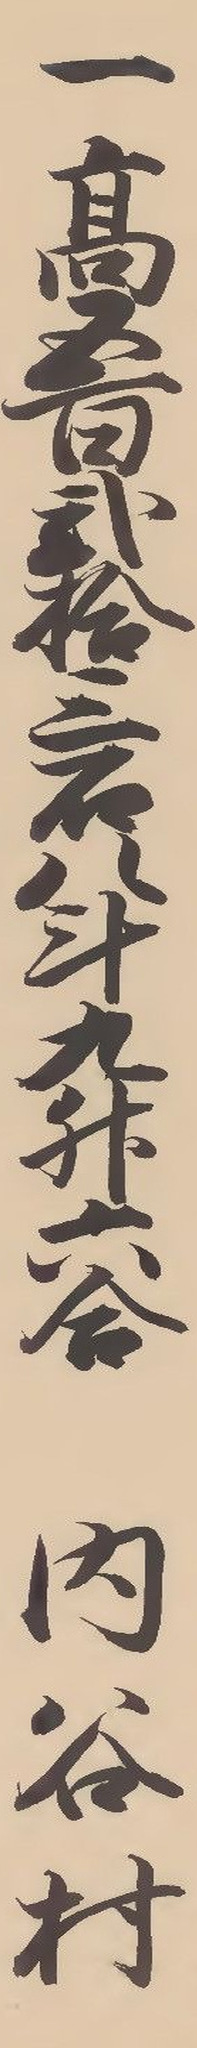一高五百弐拾三石八斗九升六合内谷村
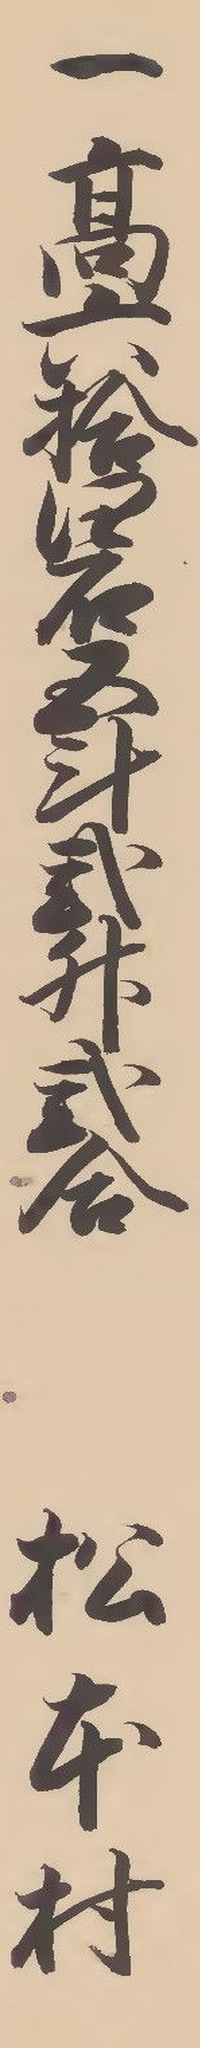一高六拾四石五斗弐升弐合松本村

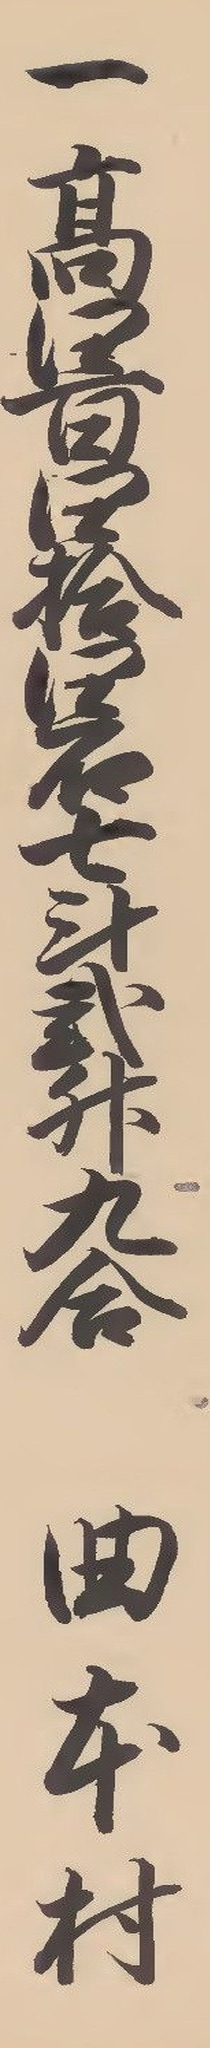一高四百四拾四石七斗弐升九合曲本村
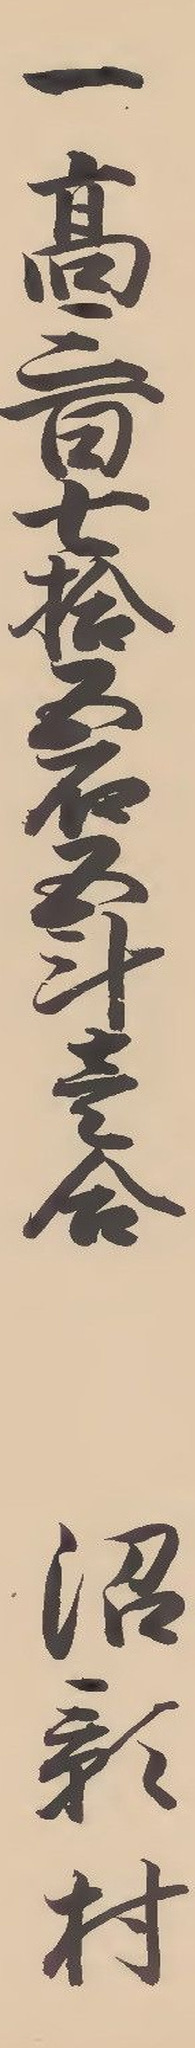一高三百七拾五石五斗壱合沼影村
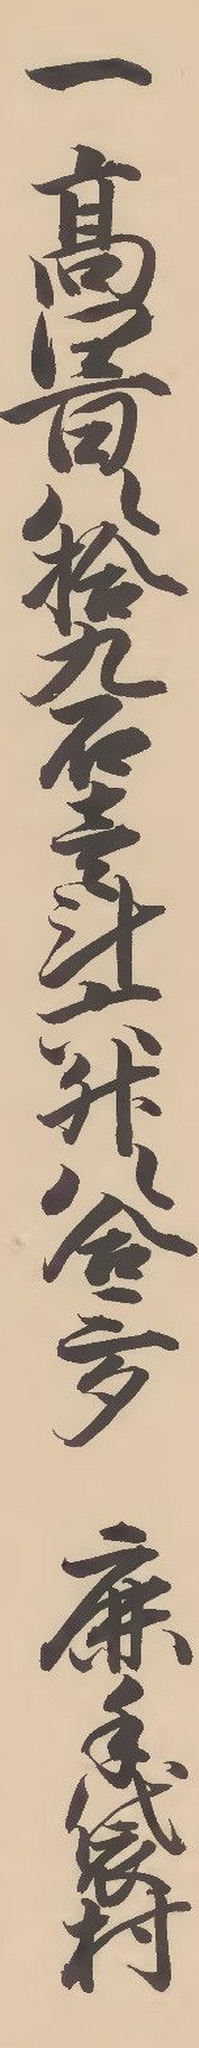一高四百八拾九石壱斗六升八合三勺鹿手袋村
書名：武蔵国郷帳　下
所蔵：国立公文書館 National Archives of Japan
